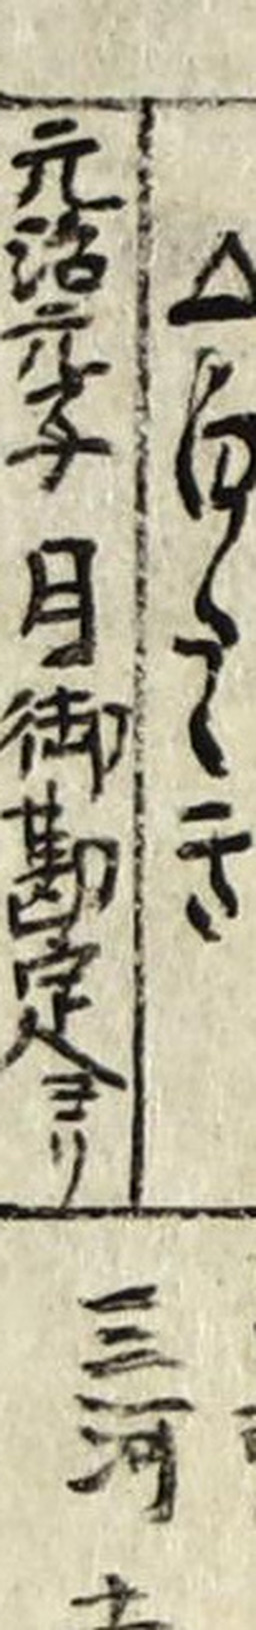元治元子月御勘定ヨリ
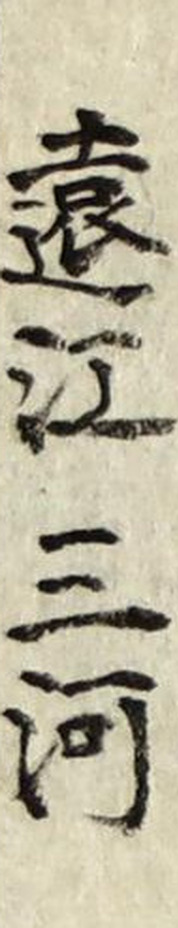遠江三河
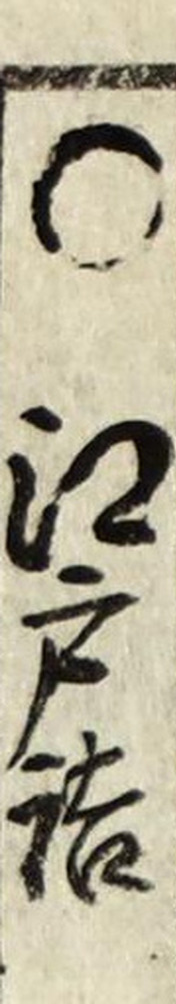○江戸詰
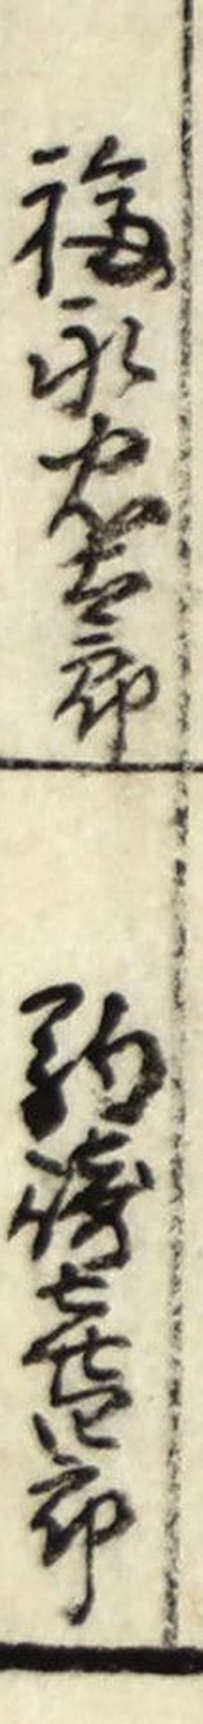福永忠太郎駒崎喜四郎
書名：（全国郡代・代官所諸役人名列）
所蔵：福井県文書館 Fukui Prefectural Archives
